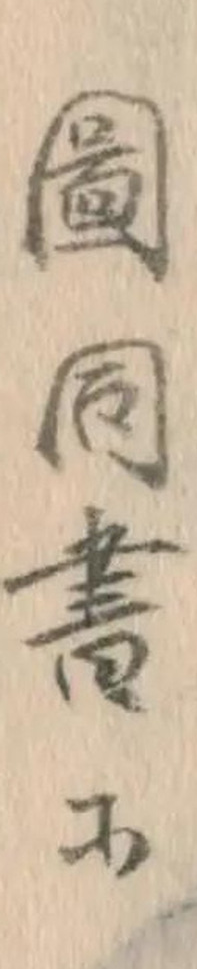図同書に
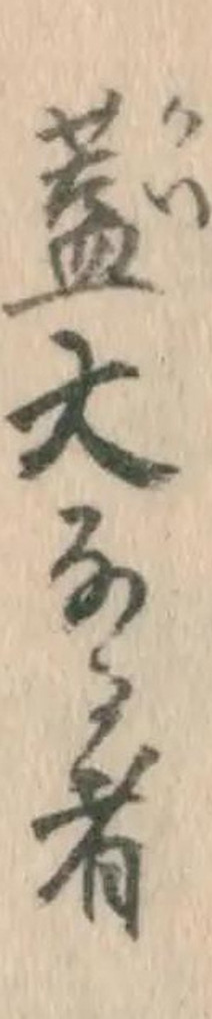蓋大なる者
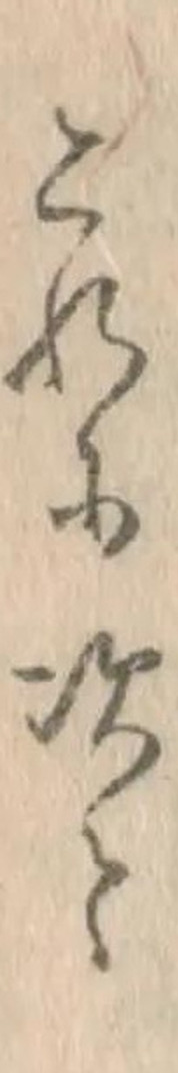これに次と
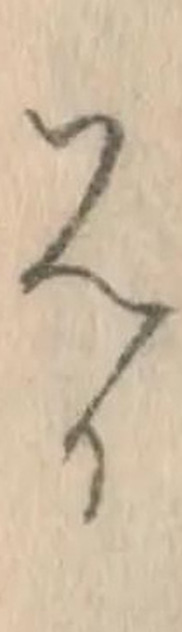いへり

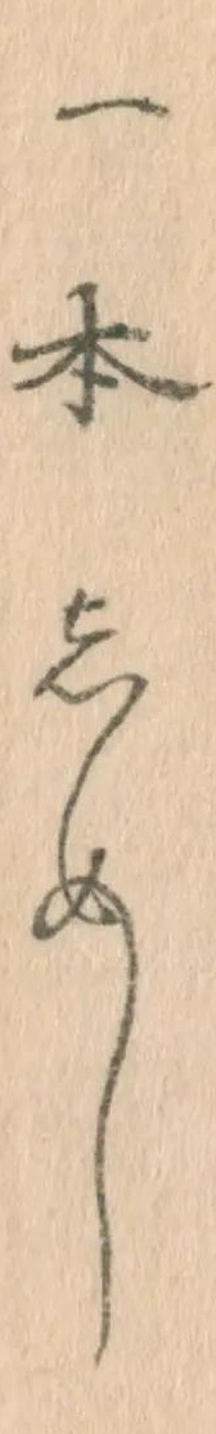一本しめし
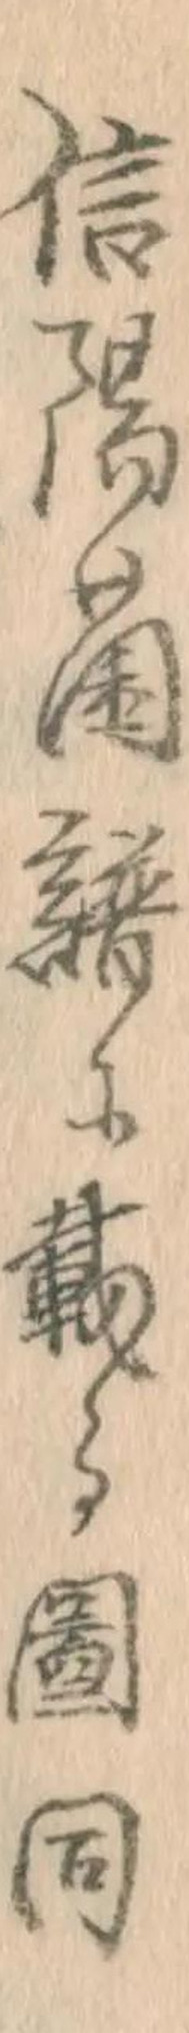信陽菌譜に載る図同
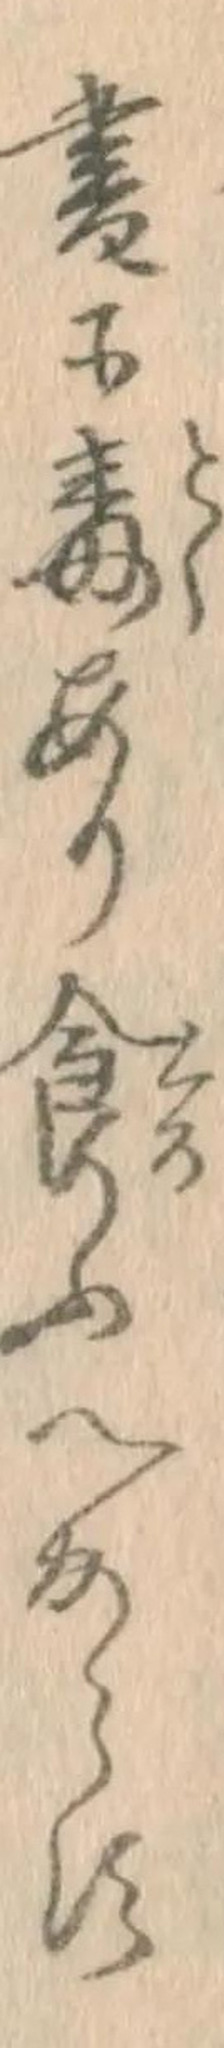書に毒あり食ふへからす
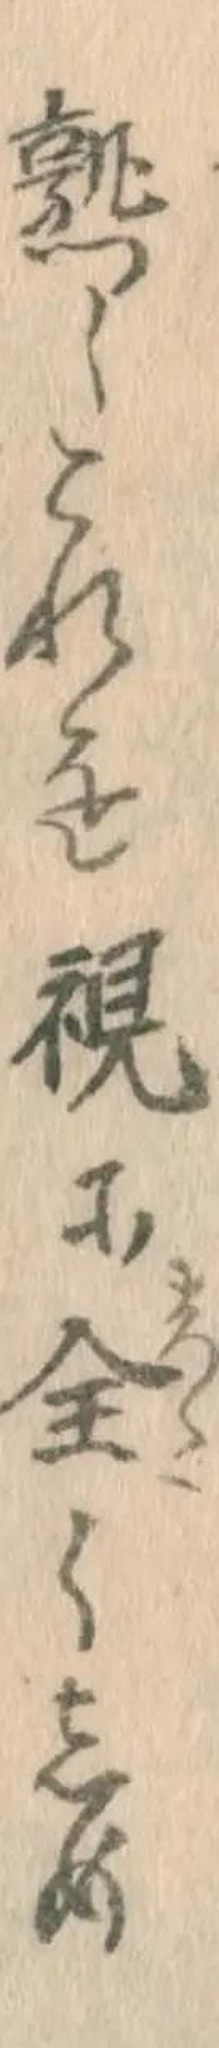熟しこれを視に全くしめ
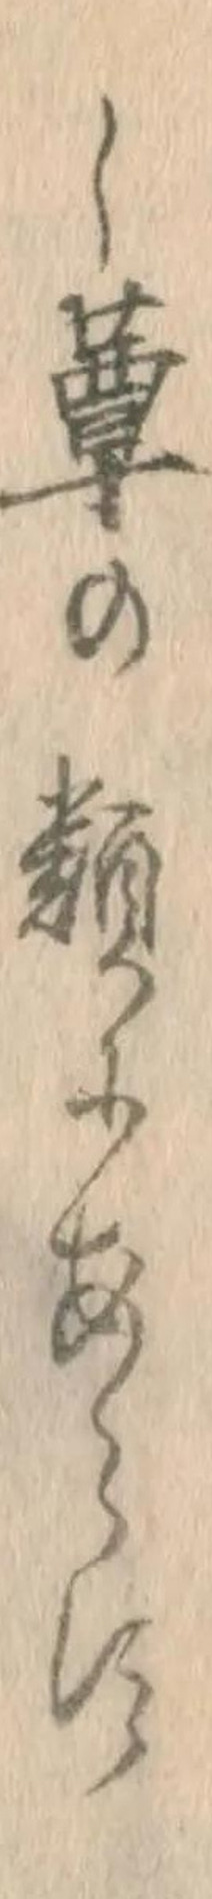し蕈の類にあらす
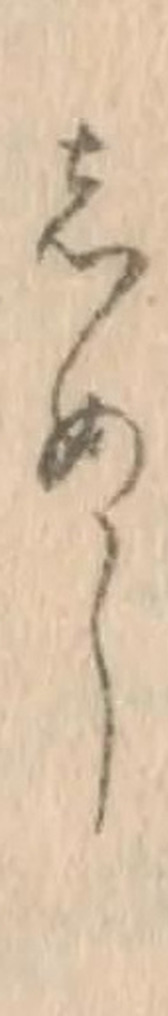しめし
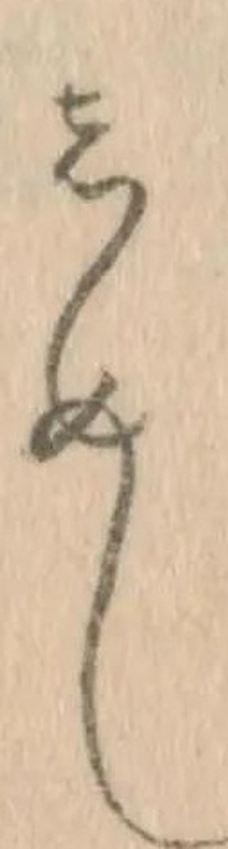しめし
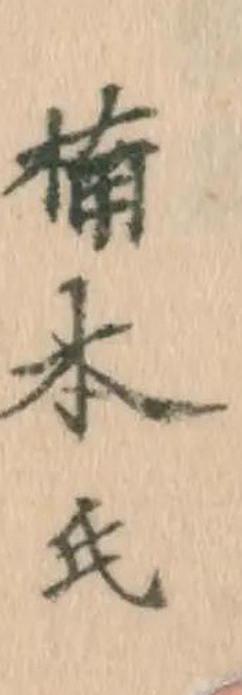楠本氏
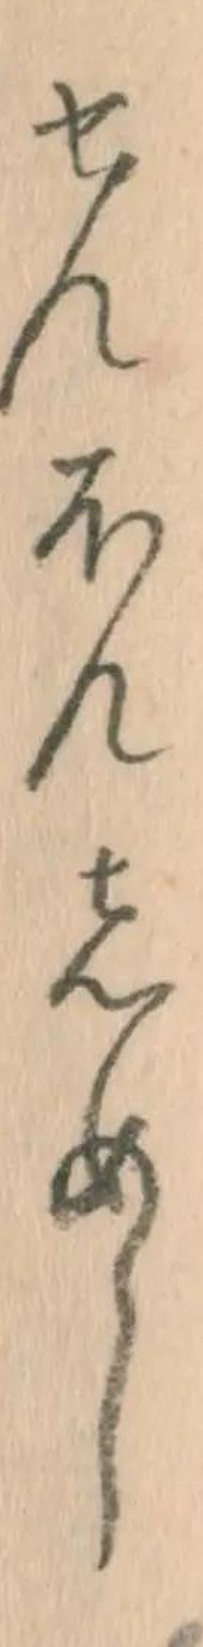せんほんしめし
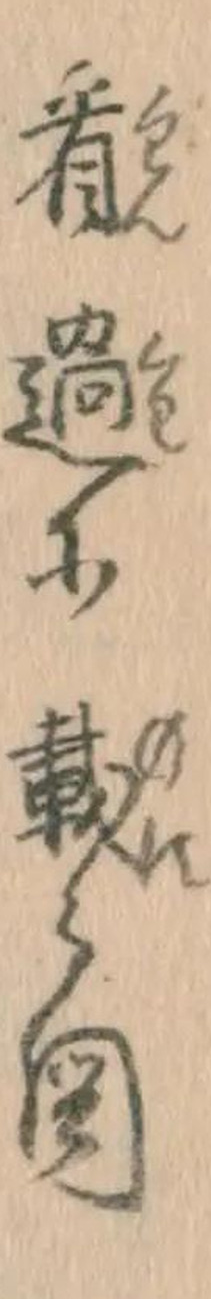看過に載る図
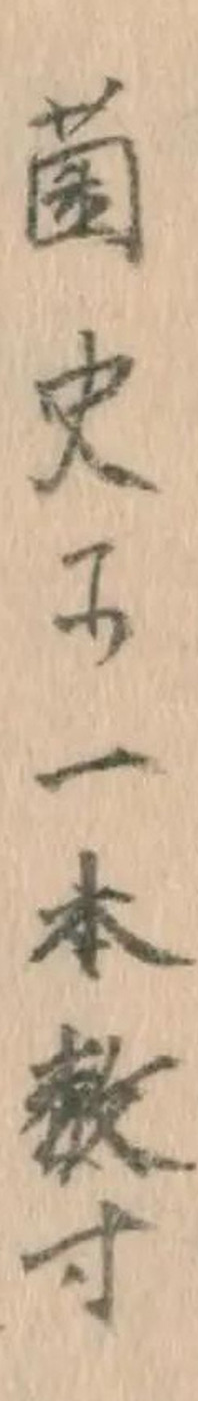菌史に一本数寸
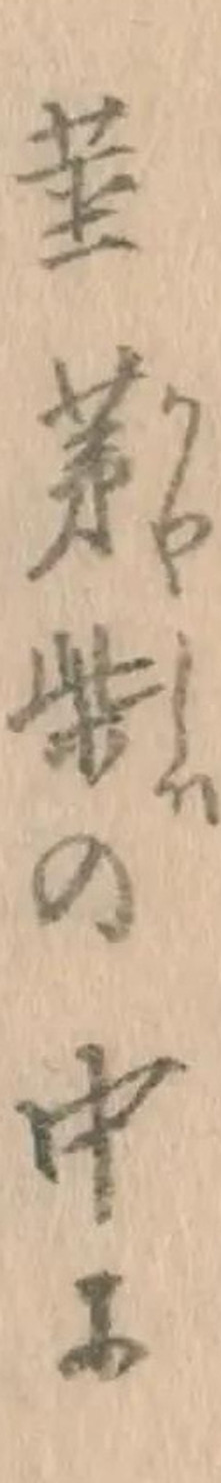茎茅柴の中に
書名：本草図譜. 巻55-57
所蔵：国立国会図書館 National Diet Library, JAPAN
